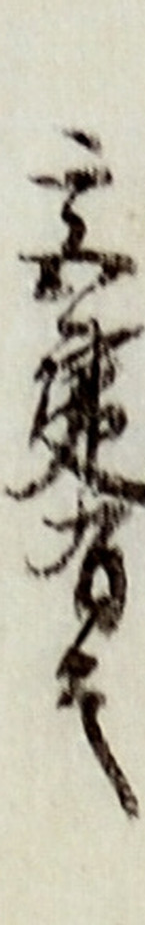宮建有之
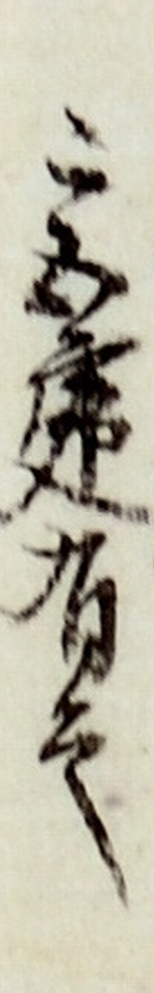宮建有之
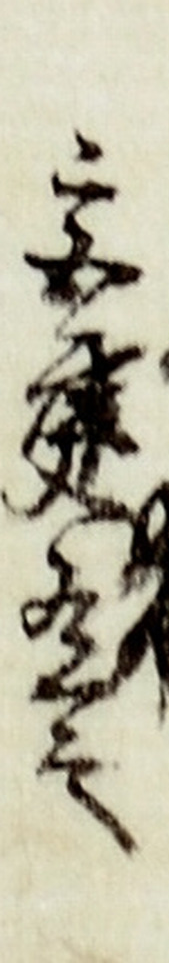宮建有之
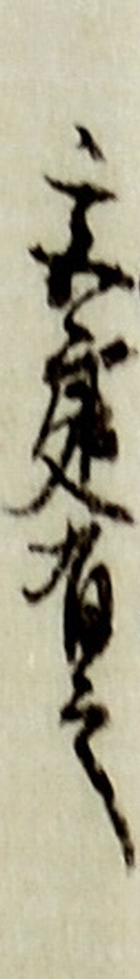宮建有之
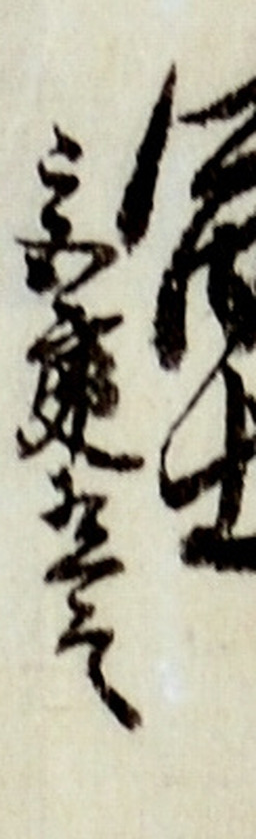宮建有之
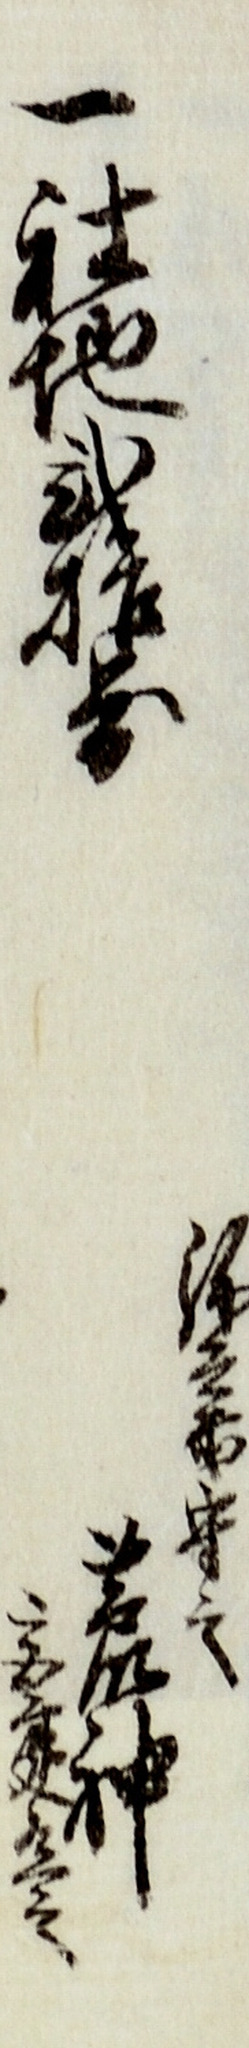一社地弐拾歩神明
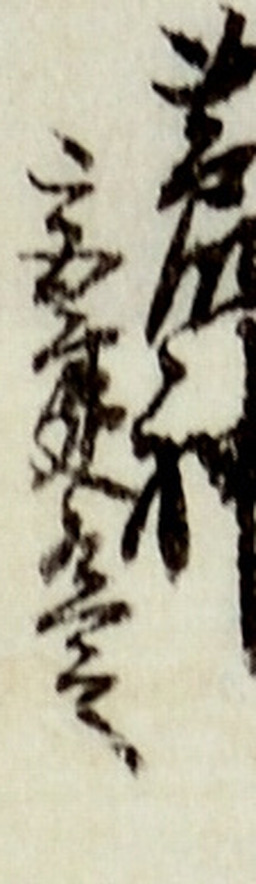宮建有之
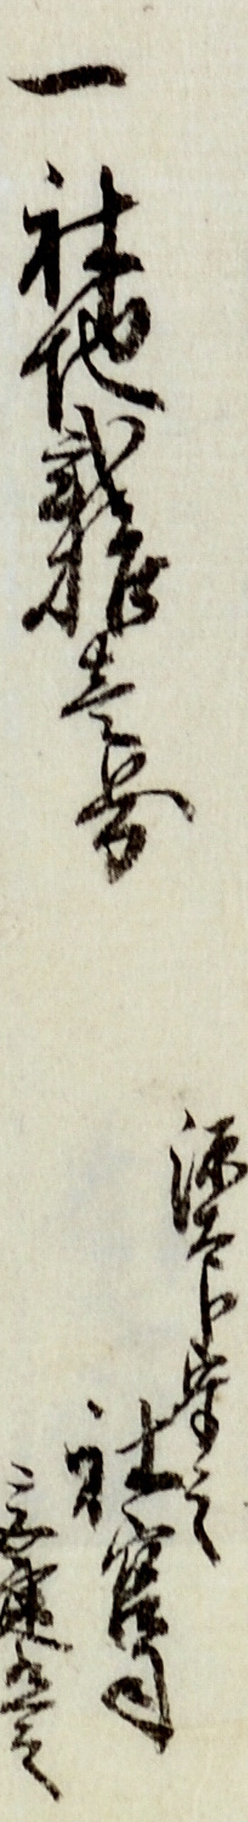一社地弐拾壱歩社宮司
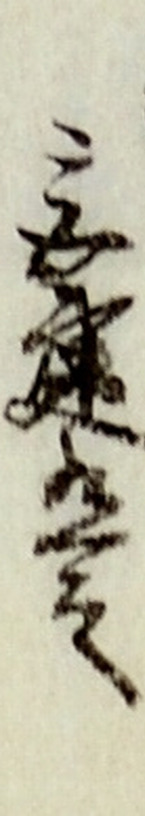宮建有之
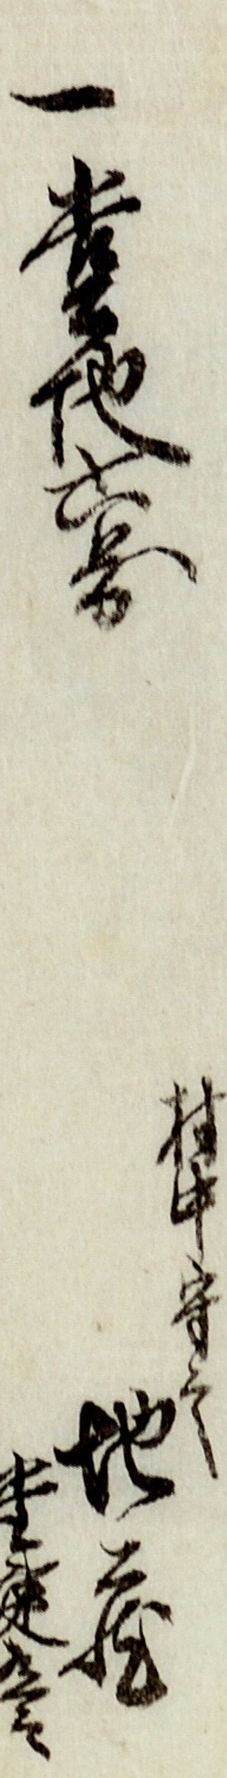一堂地六歩地蔵
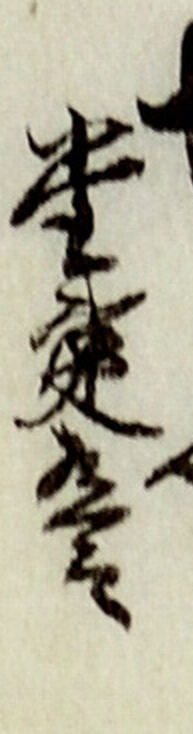宮建有之
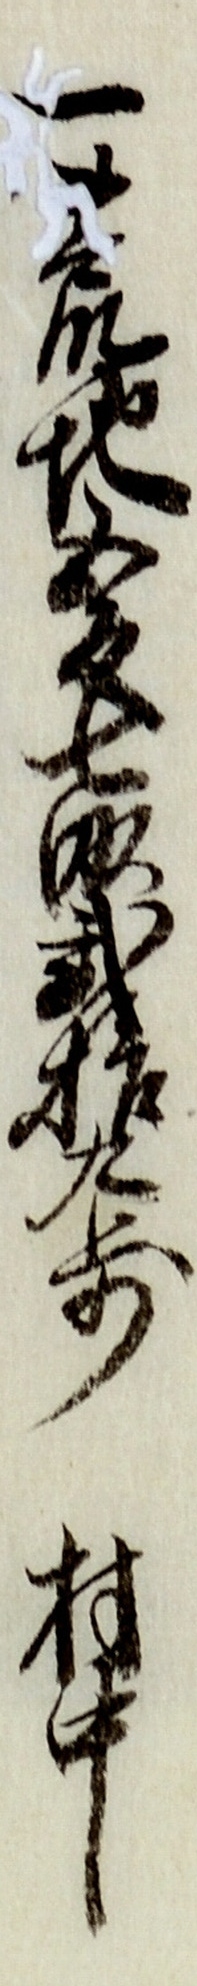一荒地五反七畝弐拾九歩村中
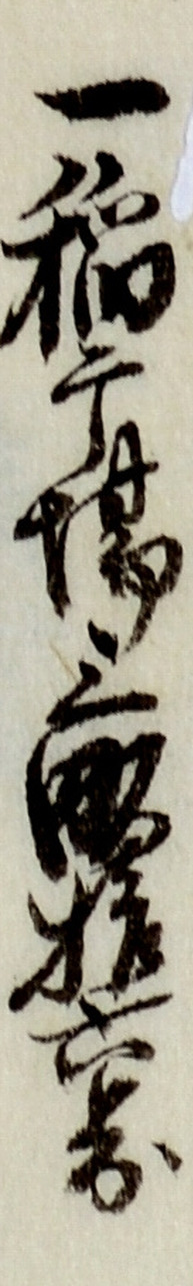一稲干場三畝拾六歩
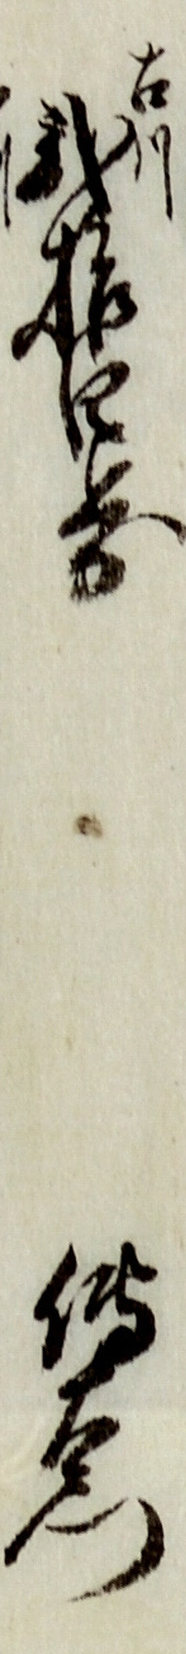弐拾四歩伝右衛門
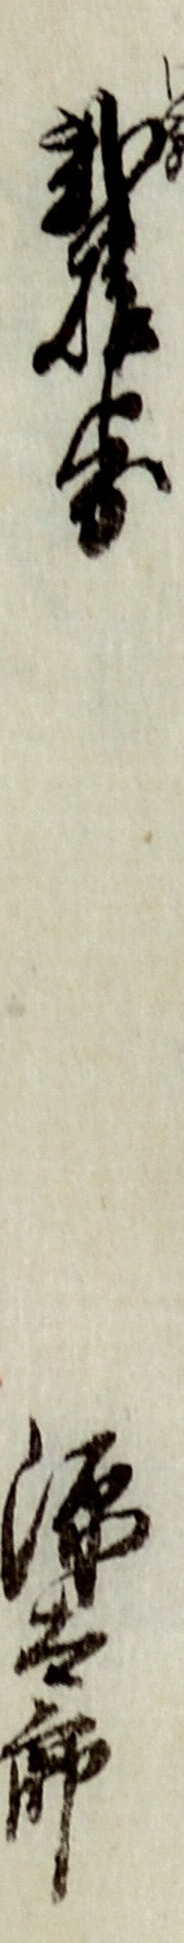弐拾歩源太郎

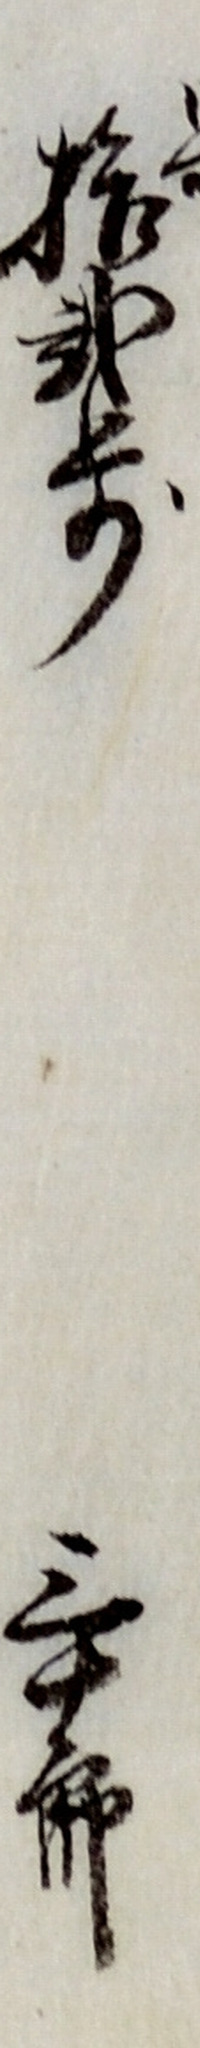拾弐歩三十郎
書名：御領分中山林社地手控
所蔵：伊那市立高遠町図書館・合同会社AMANE
